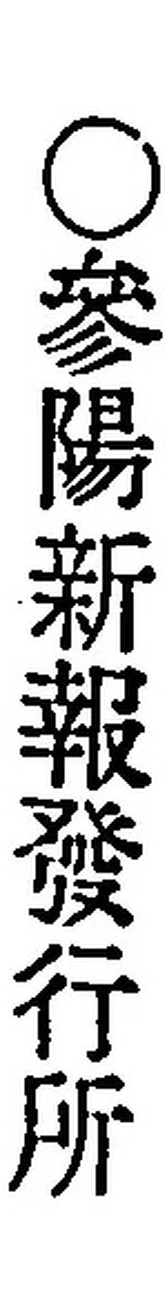○参陽新報発行所
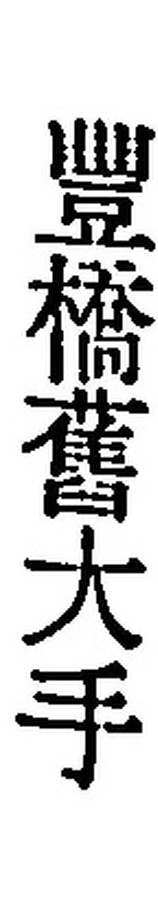豊橋旧大手
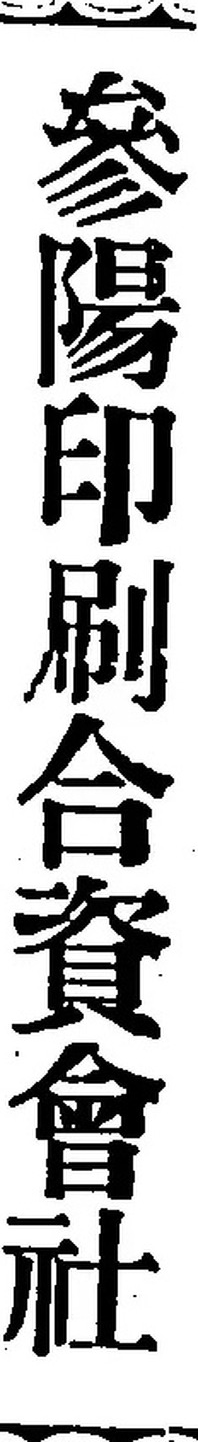参陽印刷合資会社
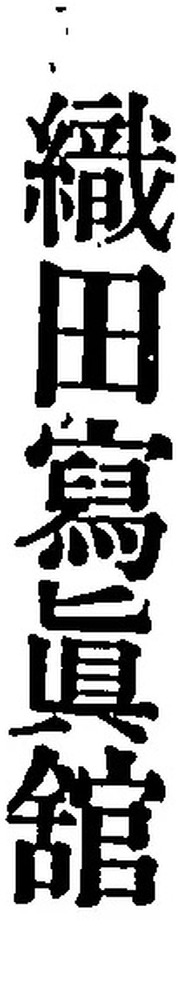織田写真舘
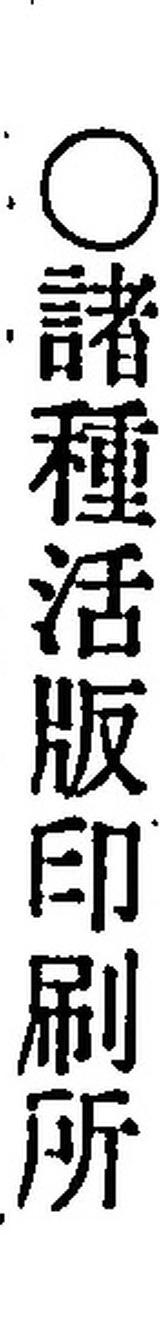○諸種活版印刷所
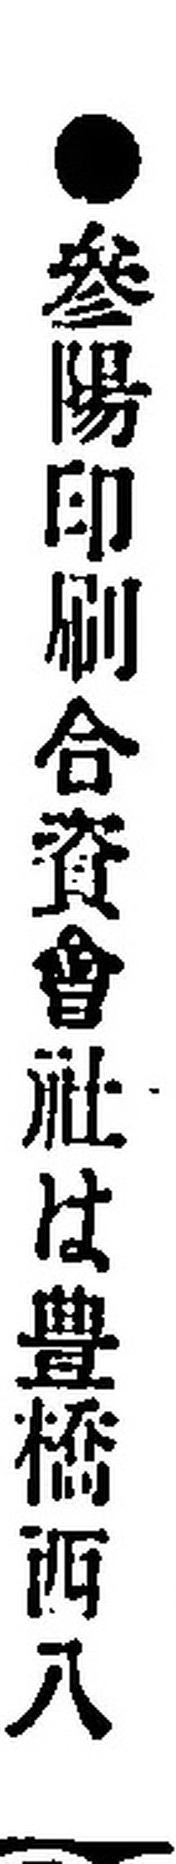●参陽印刷合資会社は豊橋西八
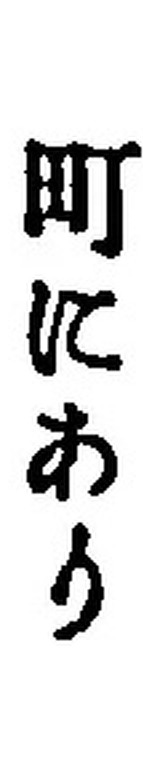町にあり

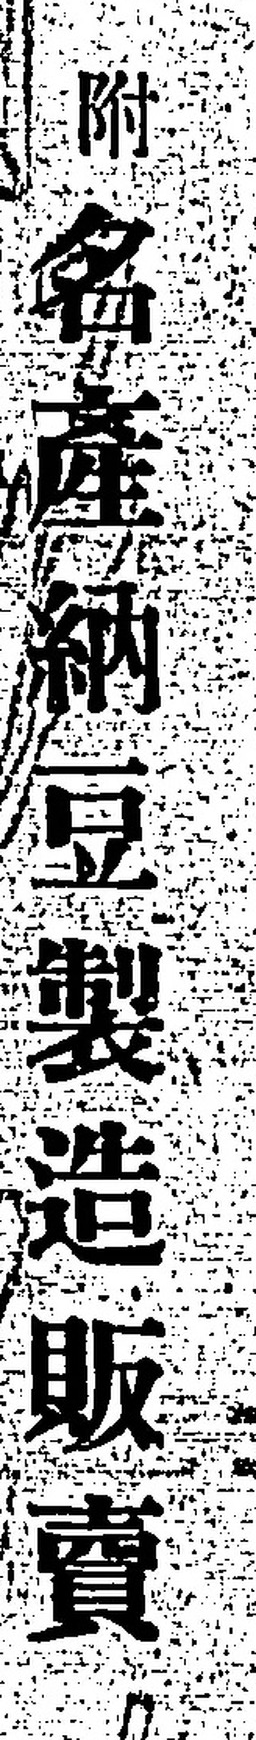附名産納豆製造販賣

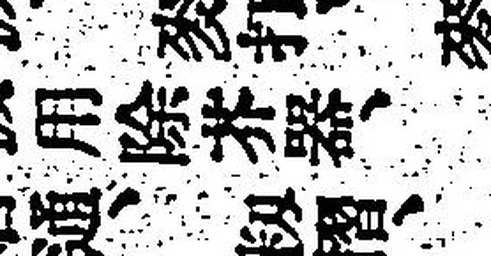穀扱用除芥器、
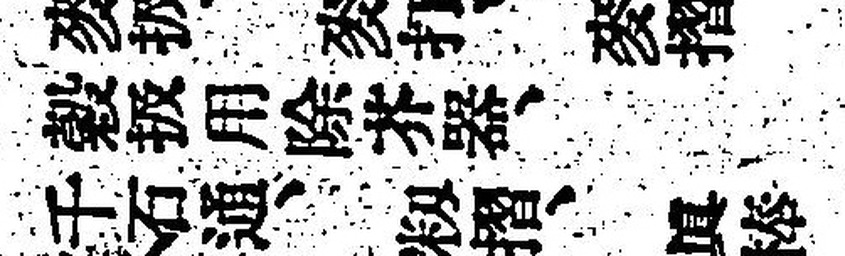穀扱用除芥器、
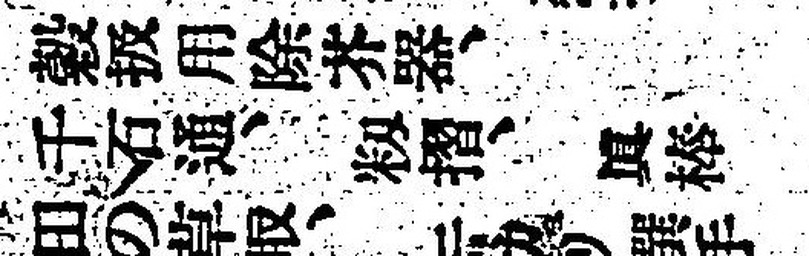千石通、籾摺、真棒
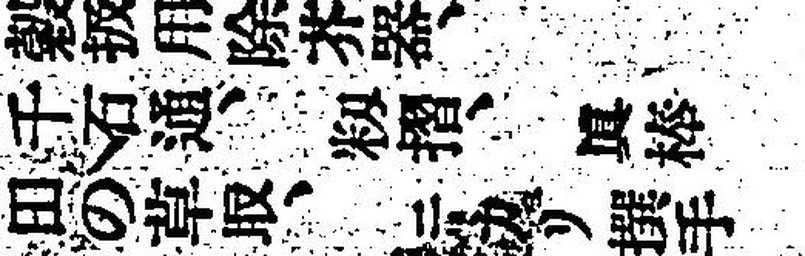千石通、籾摺、真棒
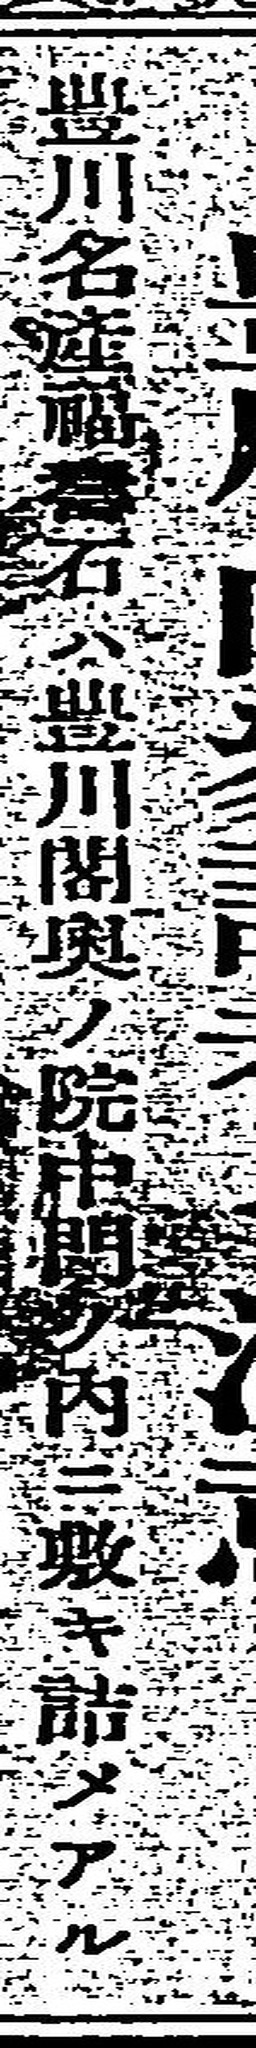豊川名産福寿石ハ豊川閣奥ノ院中門ノ内ニ敷キ詰メアル
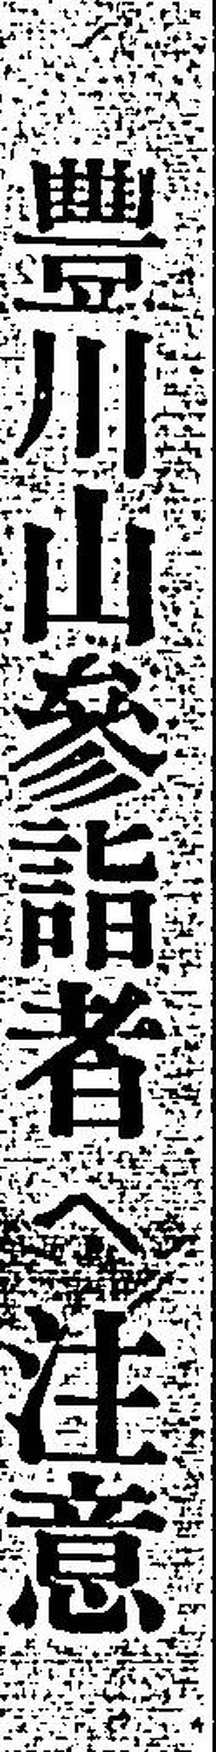豊川山参詣者ヘ注意
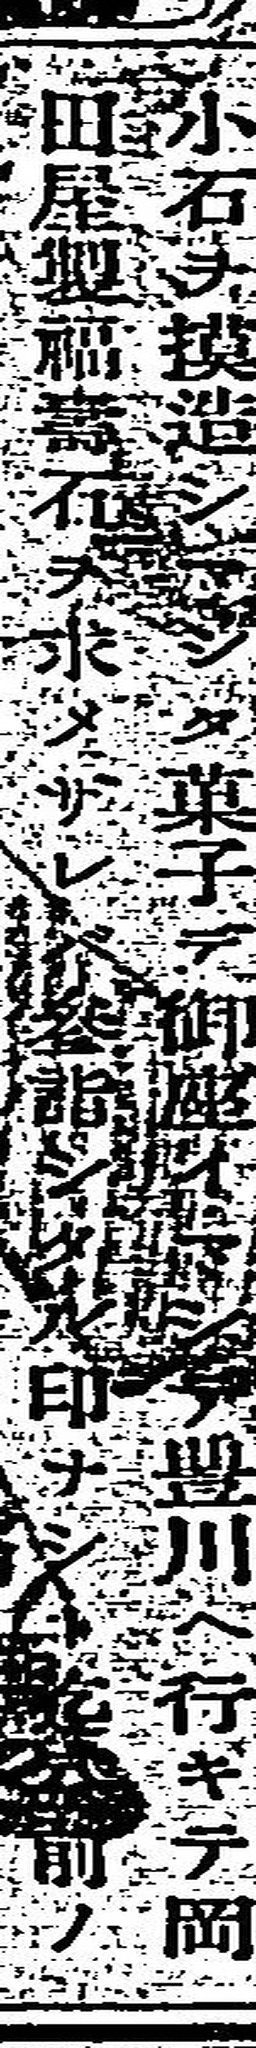田屋製福寿石ヲ求メザレバ参詣シタル印ナシ迄空前ノ
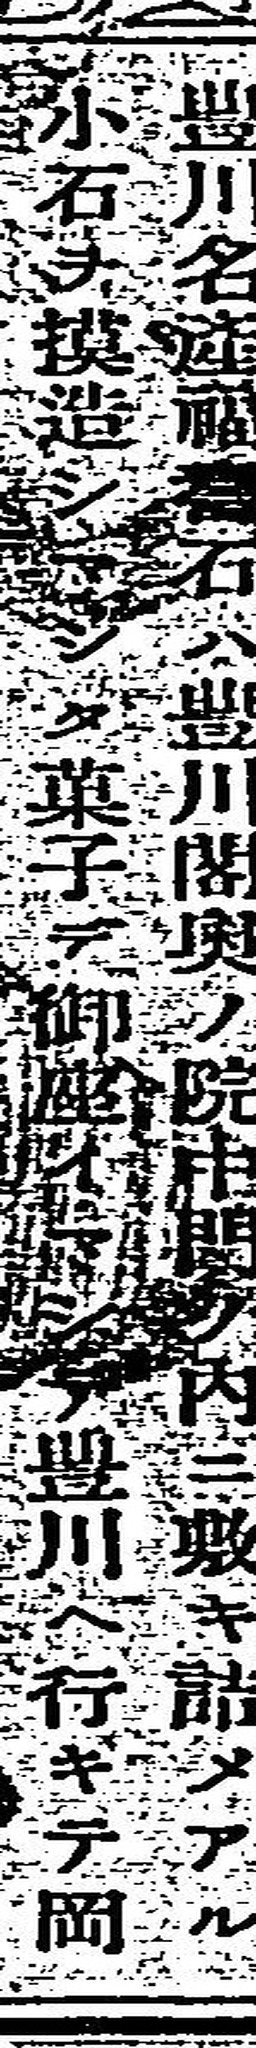小石ヲ摸造シマシタ菓子デ御座イマシテ豊川ヘ行キテ岡
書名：東参名勝案内
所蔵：国立国会図書館 National Diet Library, JAPAN
